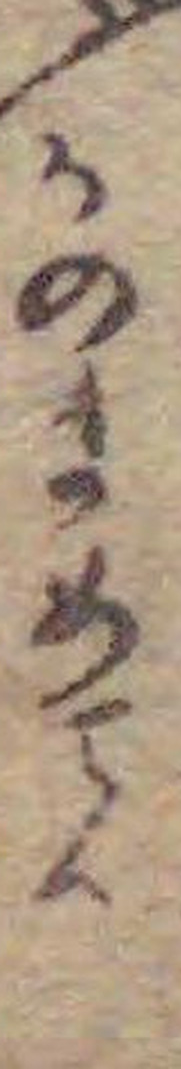かのまめてん
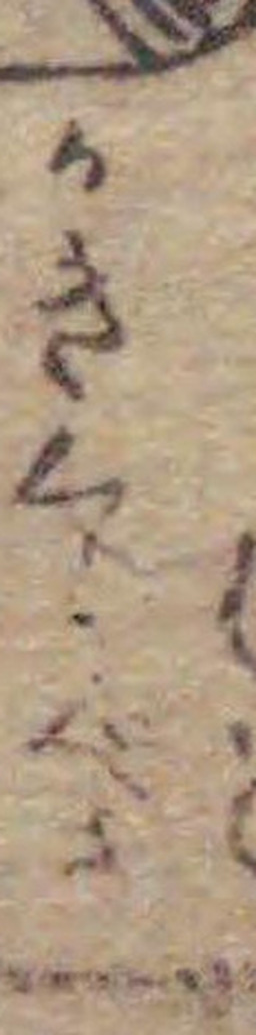かきくらべさ
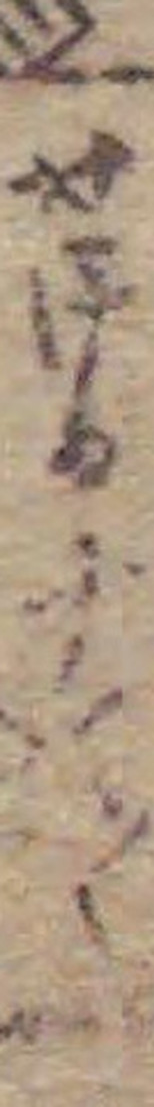せけるになか〳〵
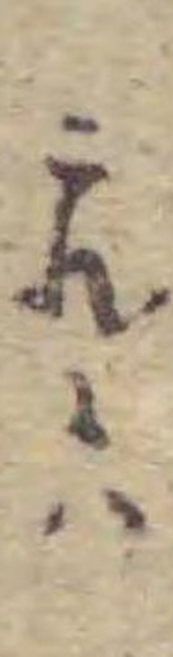これには
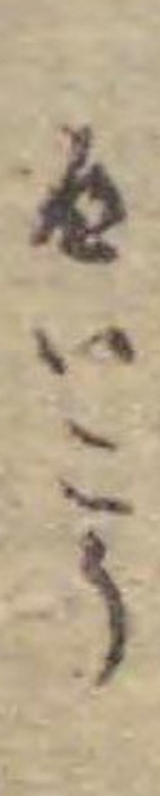へいこう
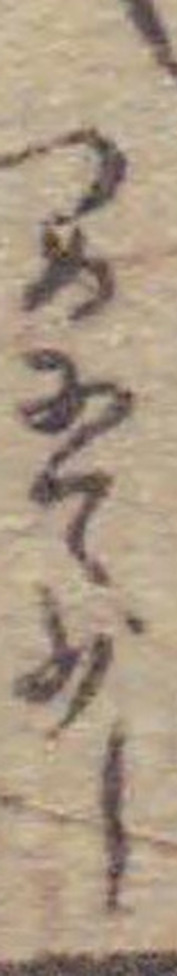つめにて少し
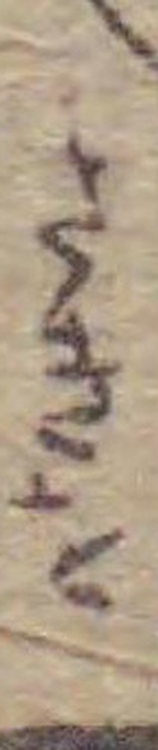さきを
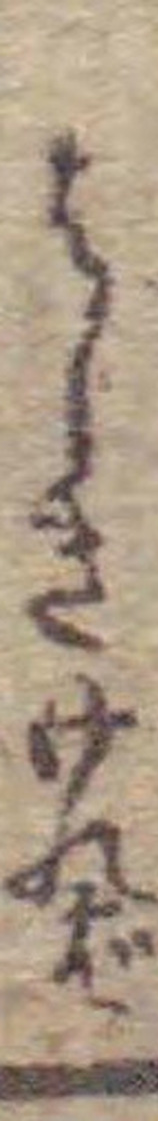はしきければ
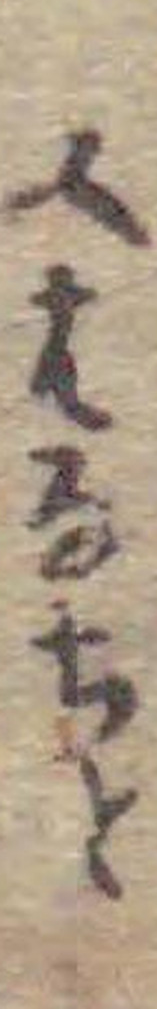又はなちと
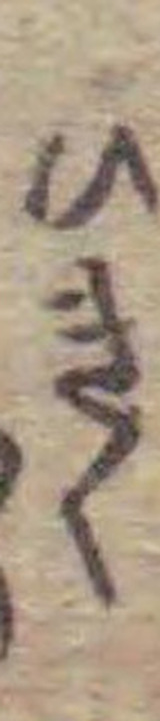ひきく
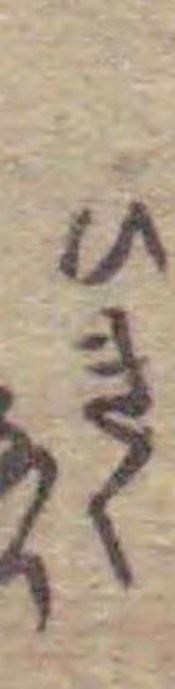ひきく

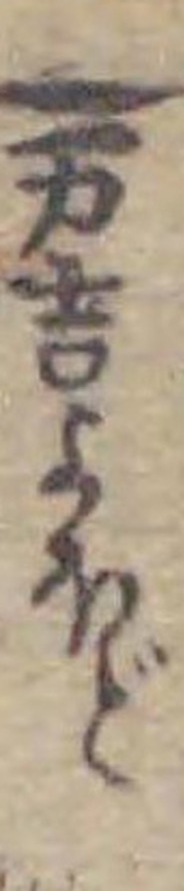万吉よほど
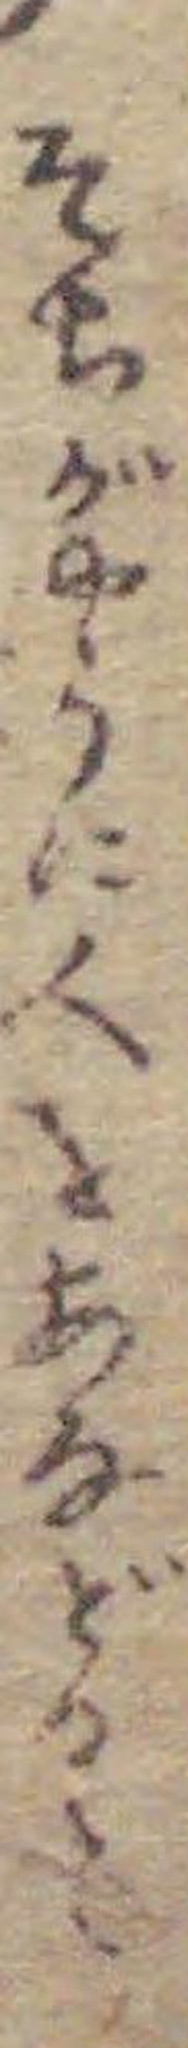そちがやうに人をあなどと
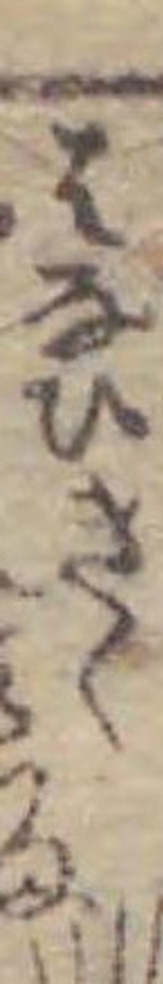はなひきく
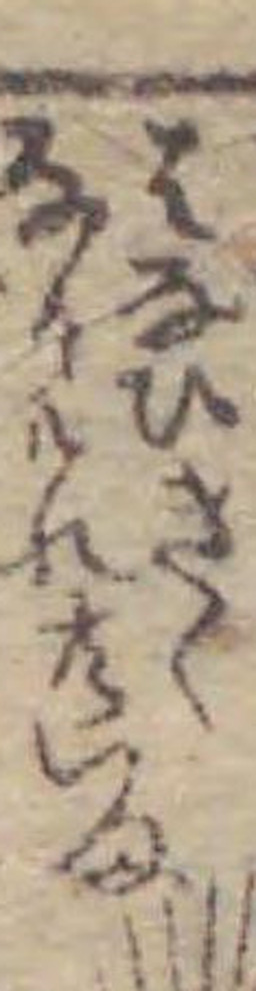なりけれ共いま
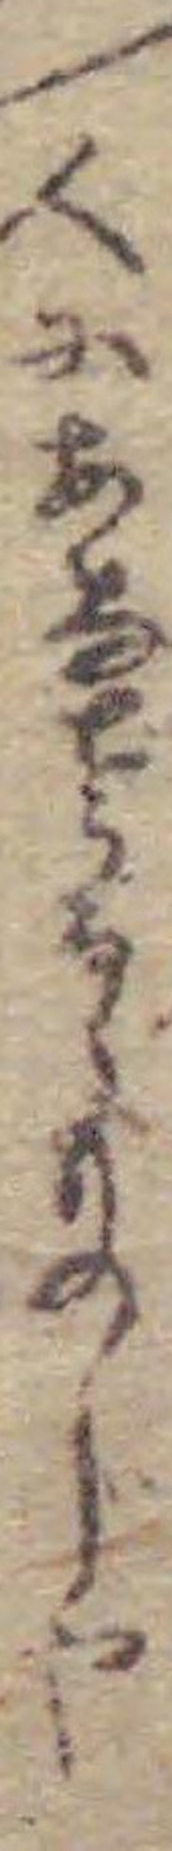人にあなどらるゝものじや
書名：鼻峰高慢男 : 2巻
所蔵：国立国会図書館 National Diet Library, JAPAN
